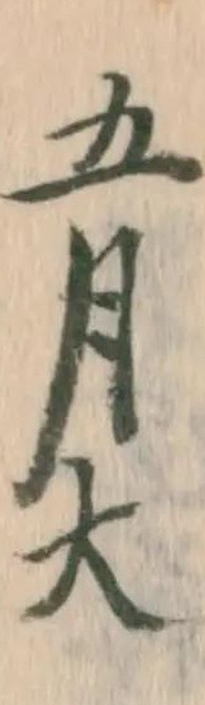五月大
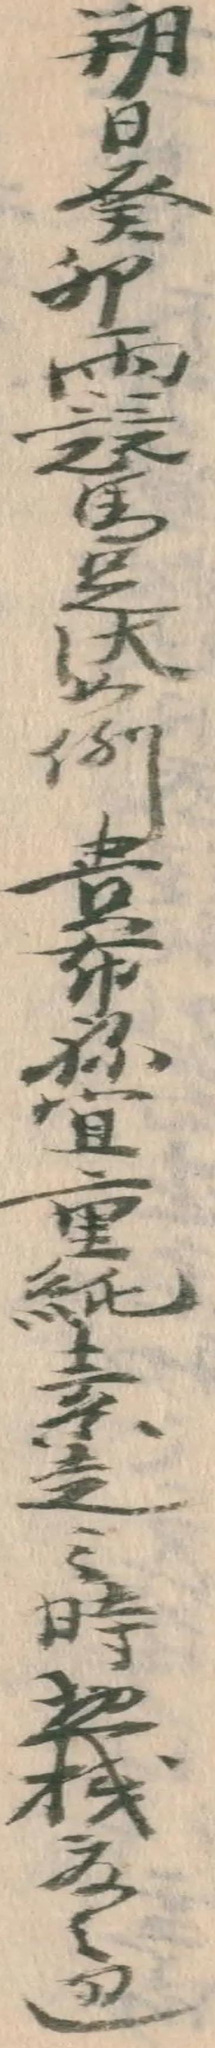朔日癸卯雨競馬足汰如例貴布祢宜重純之素走之時惣桟敷之辺
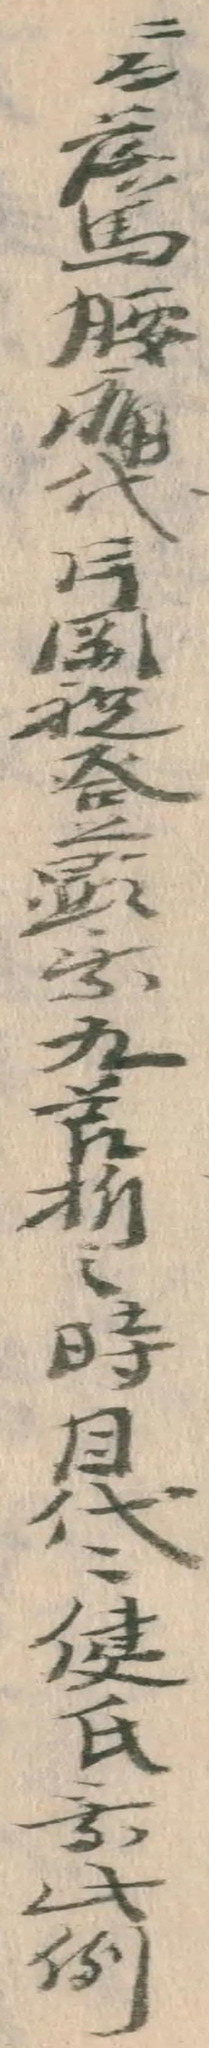二而落馬腰痛代片岡祝登顕乗九節折之時目代々健氏乗此例
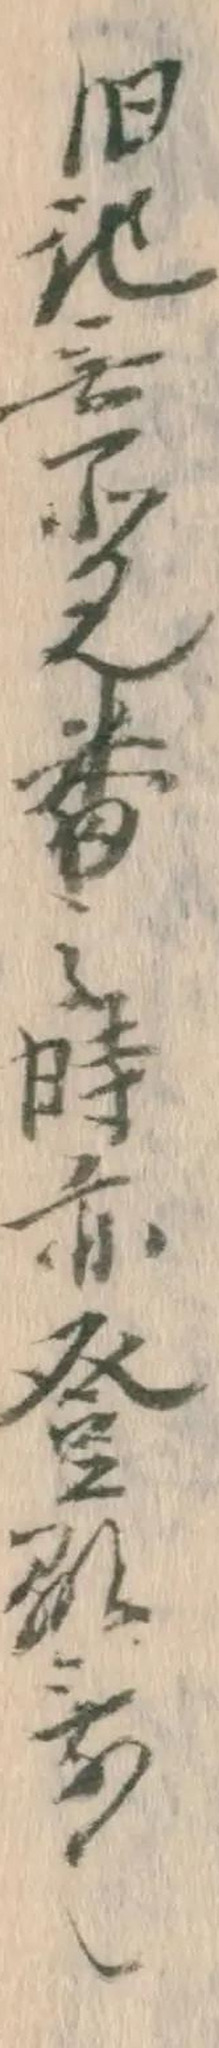旧記無所見番之時亦登顕乗也
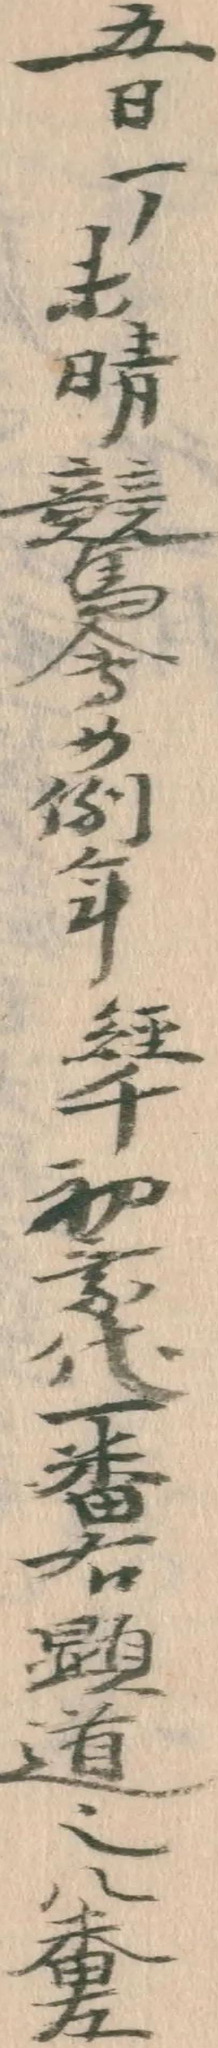五日丁未晴競馬會如例年経千初乗代一番右顕道也八番左
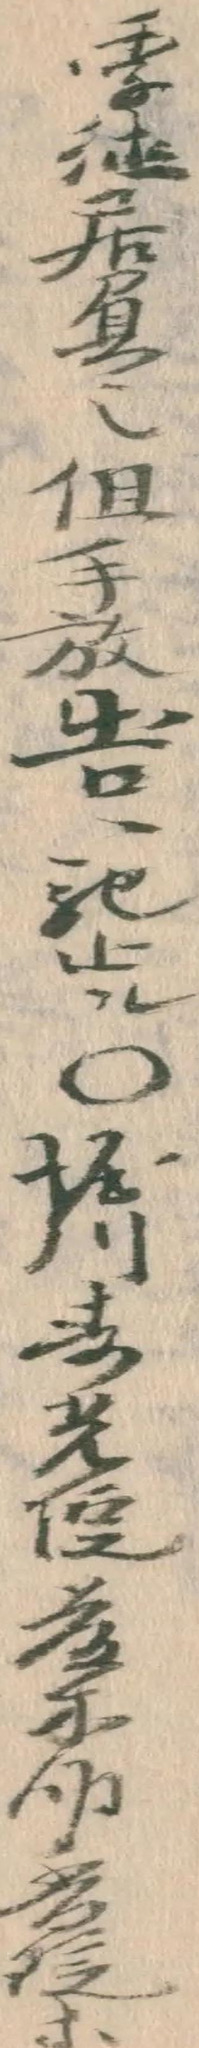季徳居負也但手放出口へ馳止ル〇堀川壽光院藤木明番院等
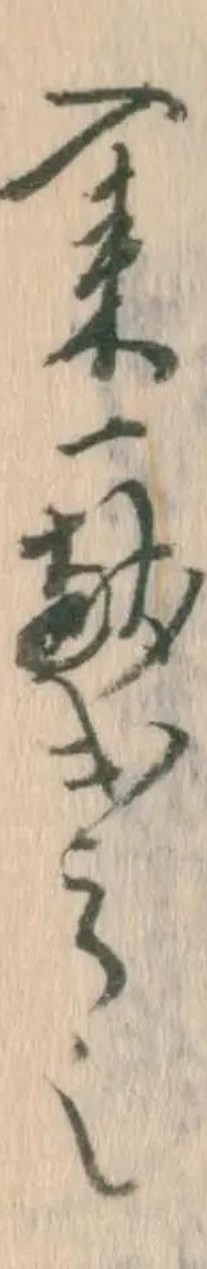入来一献出之也
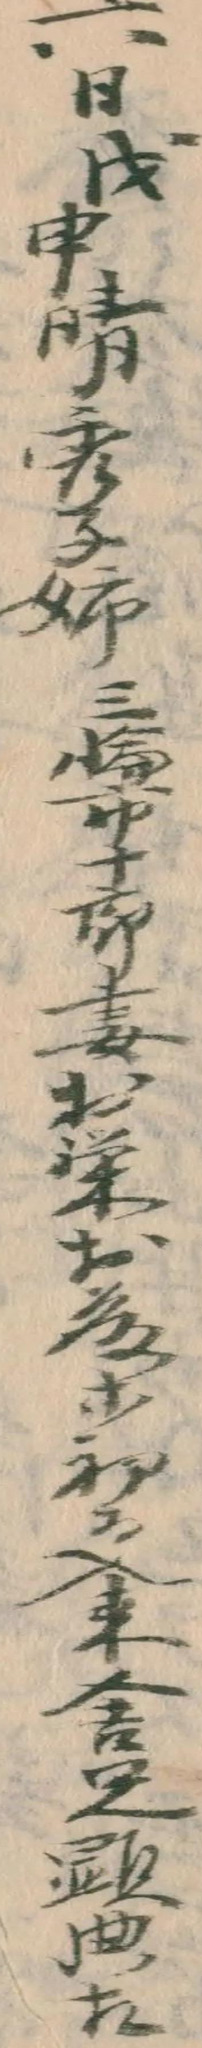六日戊申晴秀子姉三輪市十郎妻お栄お藤等初而入来舎兄顕典相
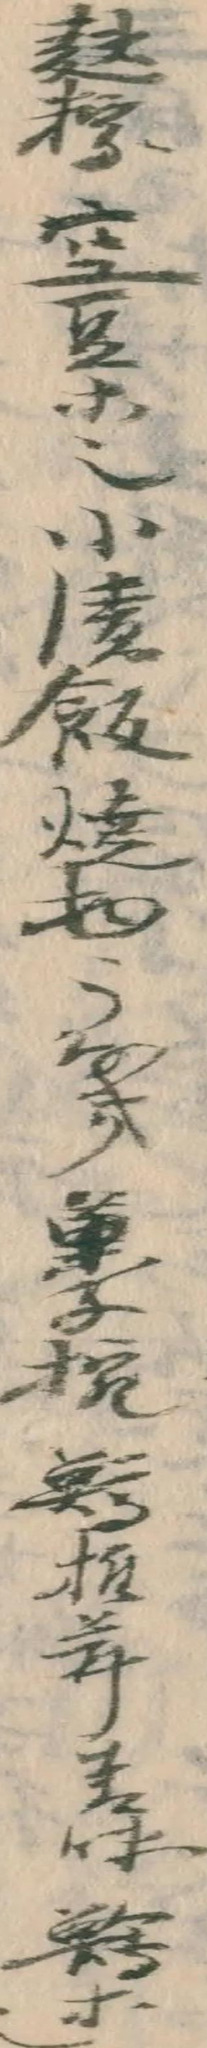麩粽空豆等也小漬飯焼物うなき菓子椀鱒椎茸香鯵鱠等也
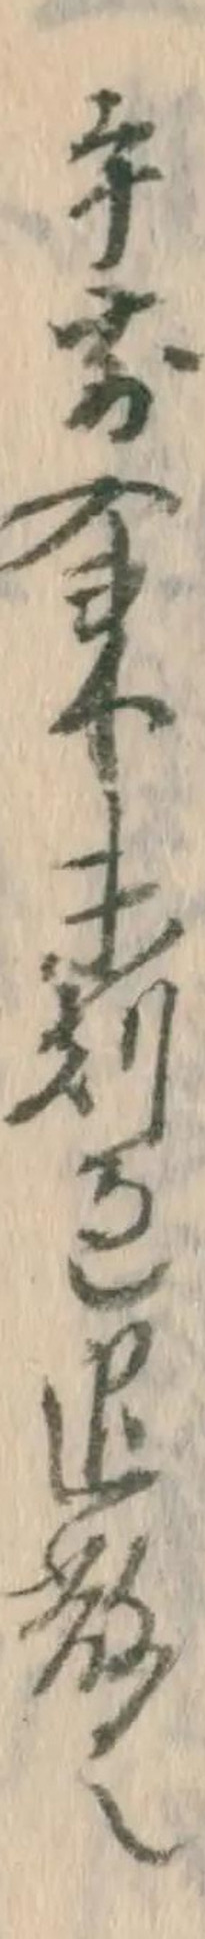午前入来未刻過退散也
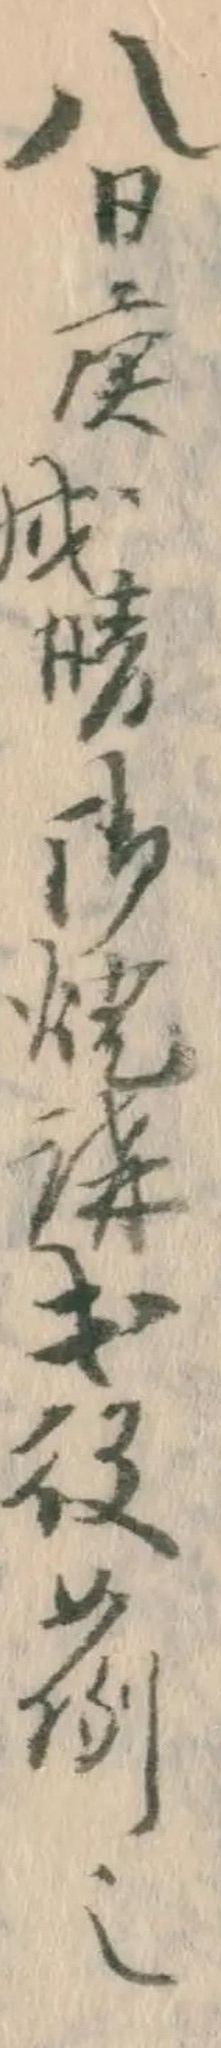八日庚戌晴御燈講出役如例也
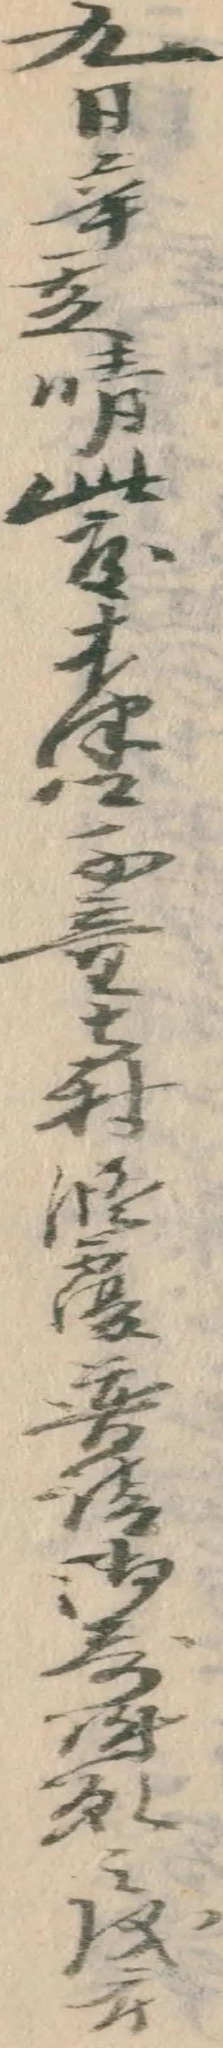九日辛亥晴此度木津郷千童寺村修覆普請御寄附願之儀ニ付
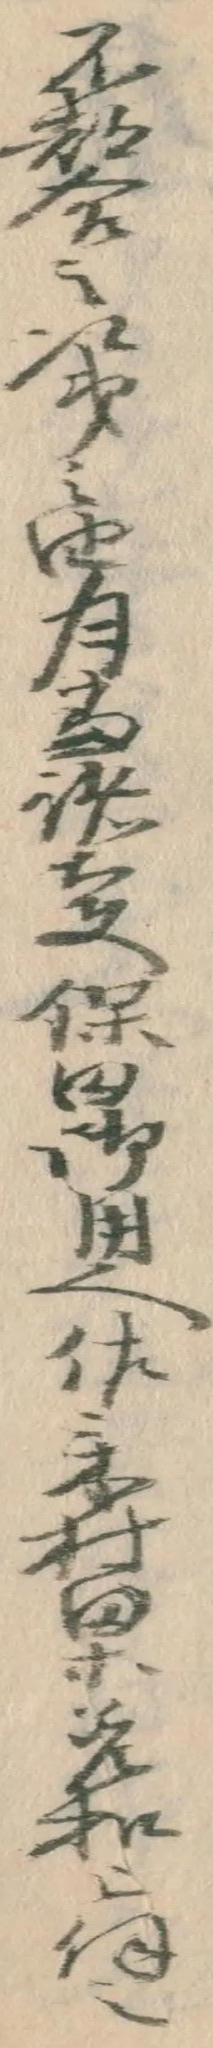不都合之次第之由月番諸大夫保田御用人佐々木村田等差扣被伺之
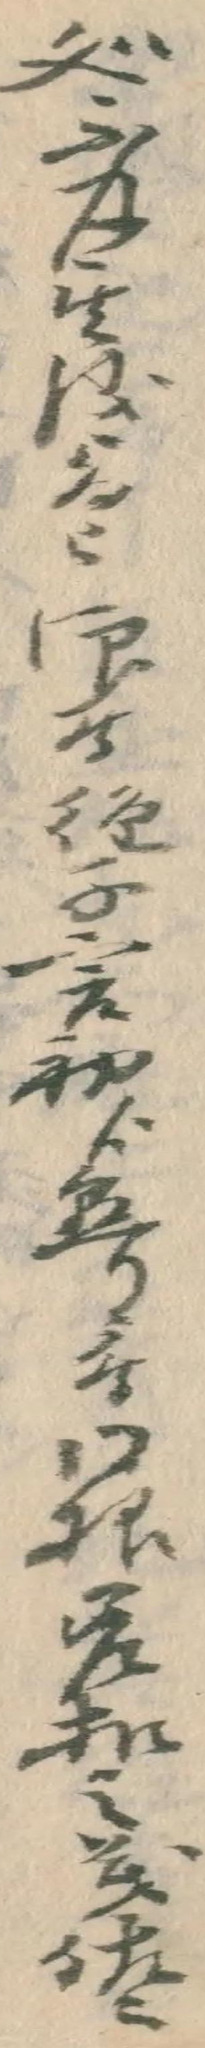処不及其儀旨被仰付経子最初ゟ懸りニ付同様差扣之義佐々
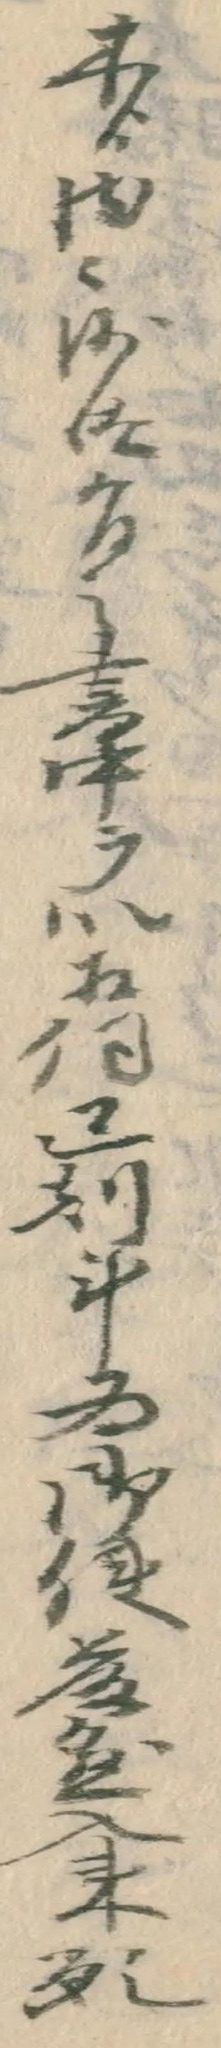木ゟ内々沙汰有之書中ヲ以相伺巳刻斗為御使藤懸入来願
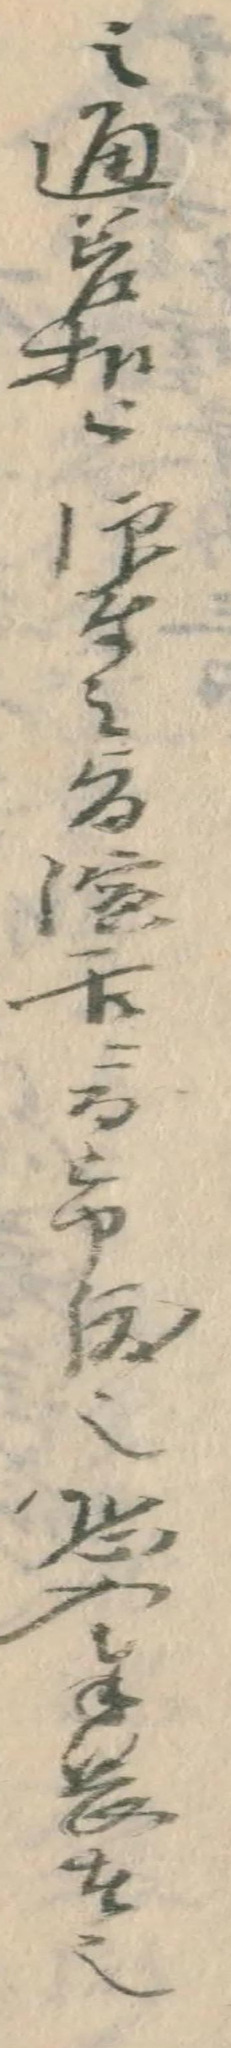之通差扣被仰付之旨演舌ニ而被申渡也恐入奉畏有也
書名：賀茂社記録. 第69冊
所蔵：国立国会図書館 National Diet Library, JAPAN
